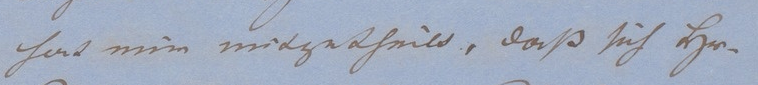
hat mir mitgetheilt, daß sich Hr.
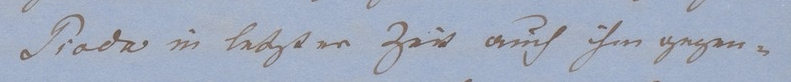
Pioda in letzter Zeit auch ihm gegen-
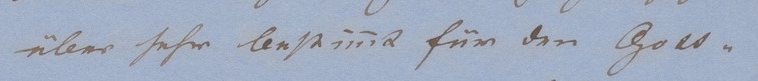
über sehr bestimmt für den Gott-
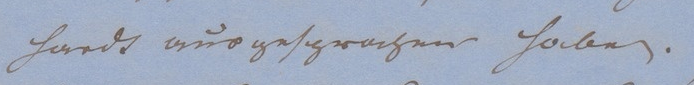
hardt ausgesprochen habe.
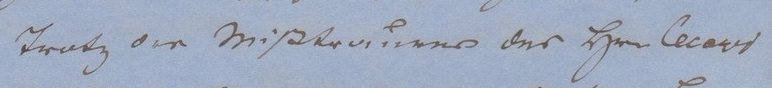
Trotz des Mißtrauens des Herr Cecovi
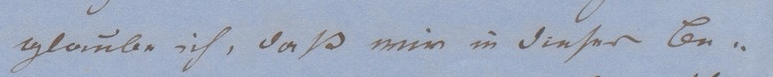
glaube ich, daß wir in dieser Be-
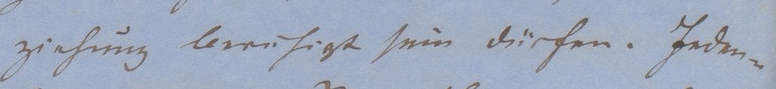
ziehung beruhigt sein dürfen. Jeden-
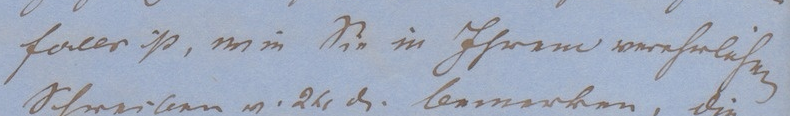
falls ist, wie Sie in Ihrem verehrlichen
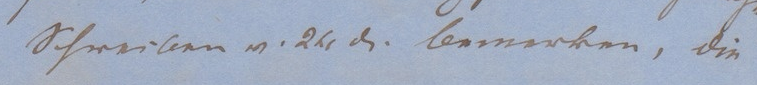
Schreiben v. 24 d. bemerken, die
